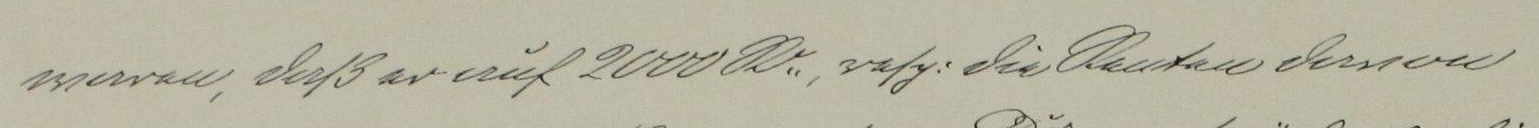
waren, daß er auf 2000 Ro., resp. die Renten davon
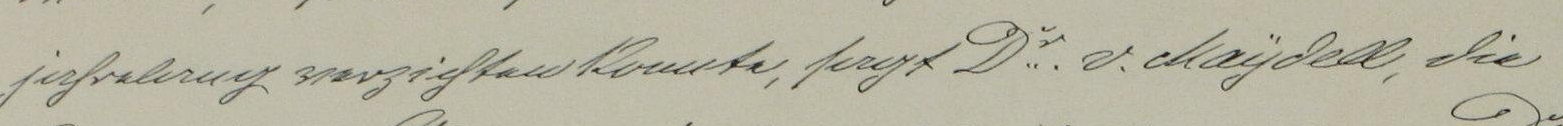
jahrelang verzichten konnte, sagt Dr. v. Maydell, die
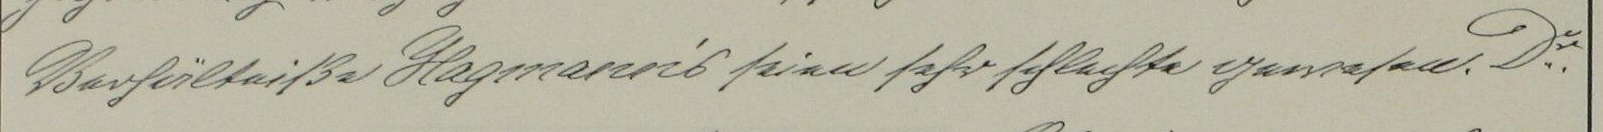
Verhältniße Hagmannʼs seien sehr schlechte gewesen. Dr.
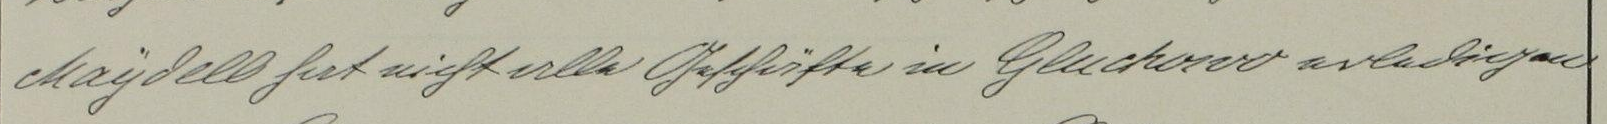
Maydell hat nicht alle Geschäfte in Gluchowo erledigen
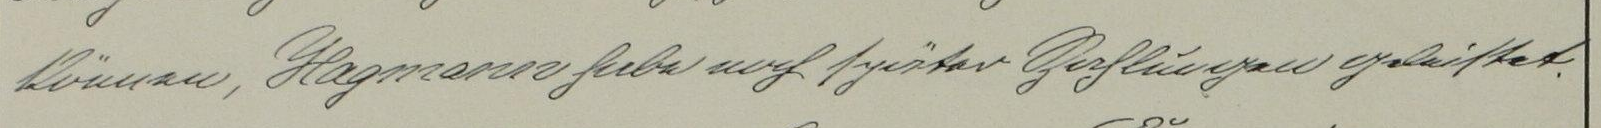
können, Hagmann habe noch später Zahlungen geleistet.
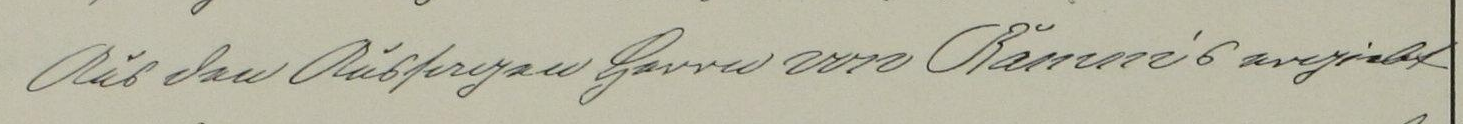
Aus den Aussagen Herrn von Rammʼs ergiebt
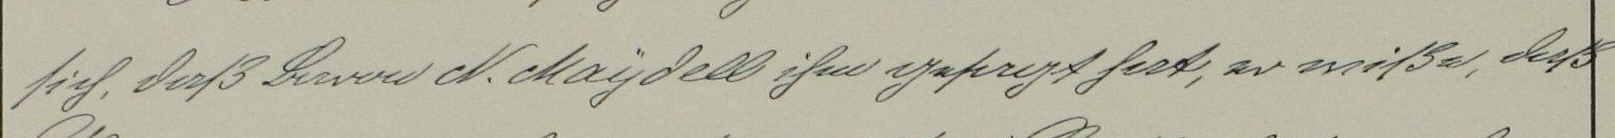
sich, daß Baron N. Maydell ihm gesagt hat, er wiße, daß
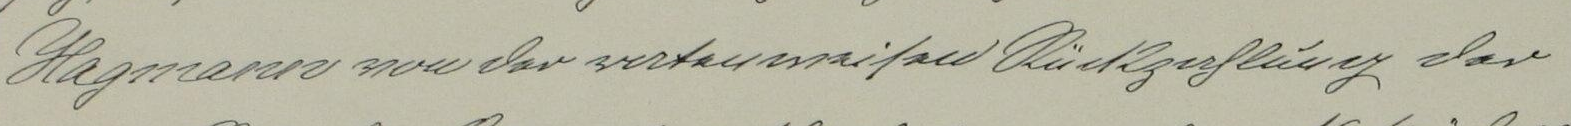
Hagmann von der ratenweisen Rückzahlung der
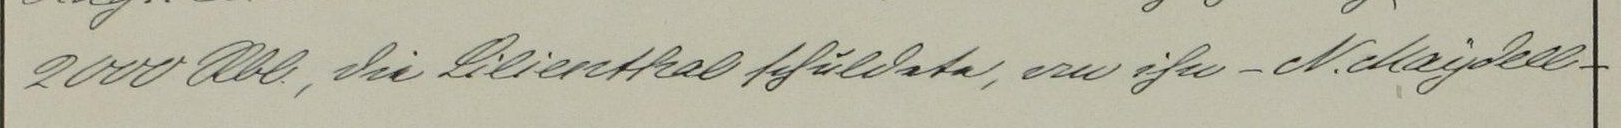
2000 Rbl., die Lilienthal schuldete, an ihn – N. Maydell –
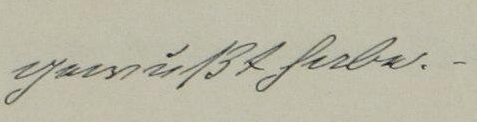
gewußt habe.
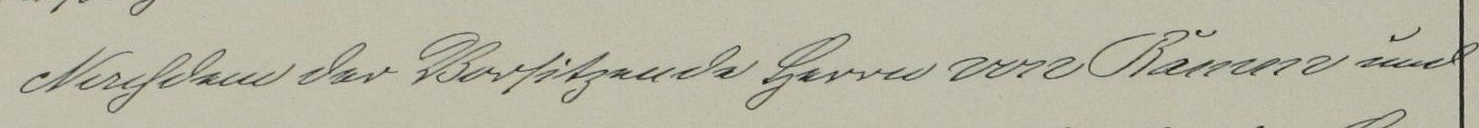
Nachdem der Vorsitzende Herrn von Ramm und
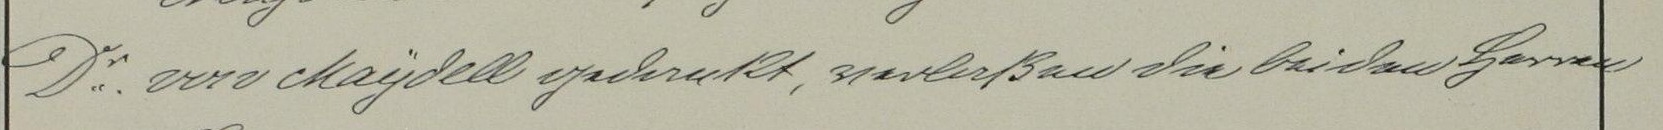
Dr. von Maydell gedankt, verlaßen die beiden Herren
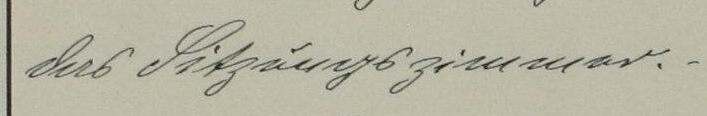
das Sitzungszimmer.
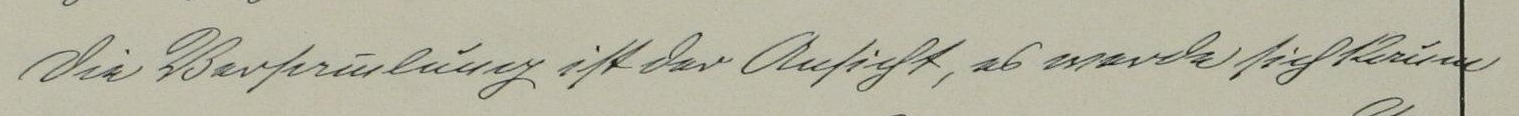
Die Versammlung ist der Ansicht, es werde sich kaum
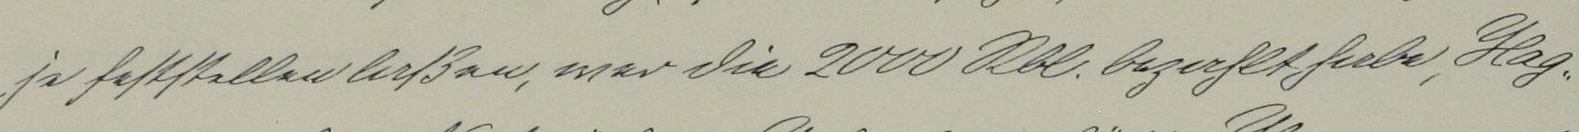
je feststellen laßen, wer die 2000 Rbl. bezahlt habe, Hag-
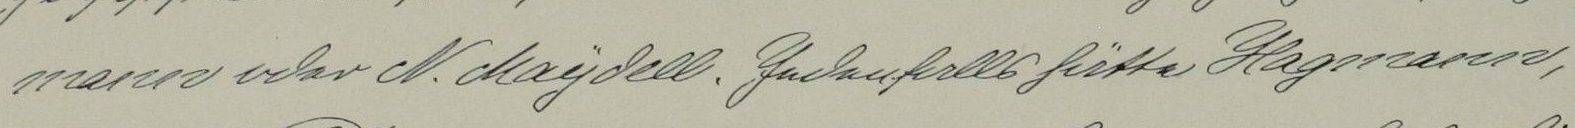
mann oder N. Maydell. Jedenfalls hätte Hagmann,
